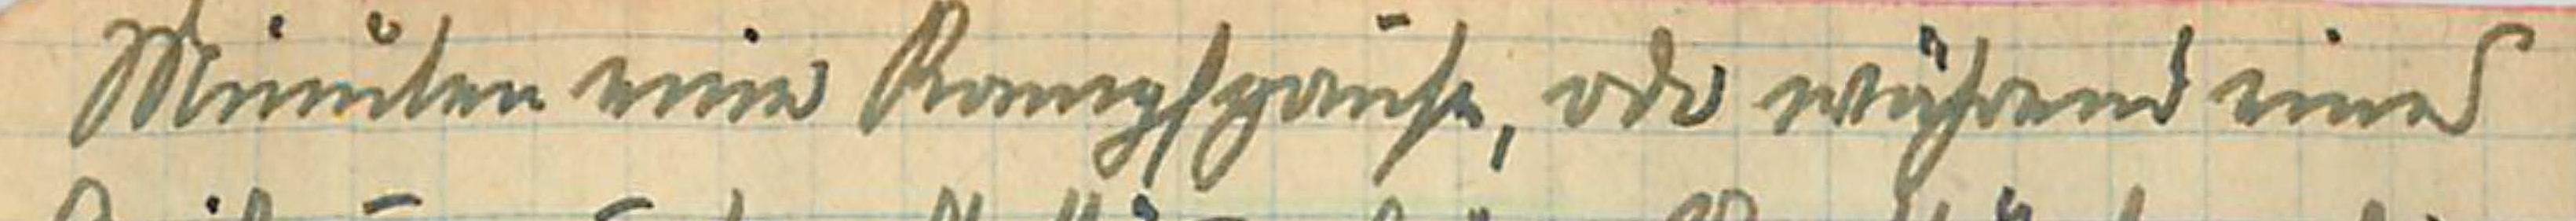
Minuten einer Kampfpause, oder während eines
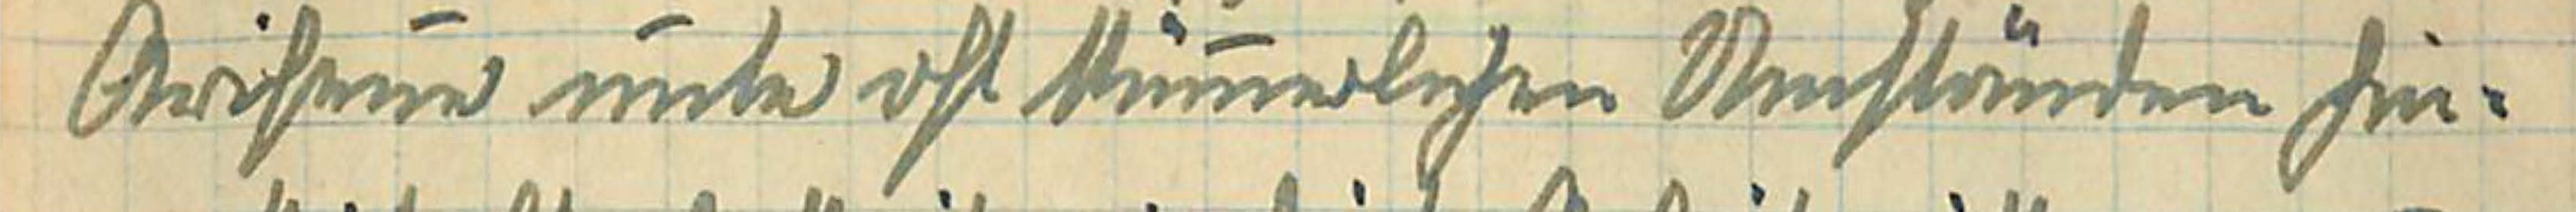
Arifeuer unter oft kümmerlichen Umständen hin-
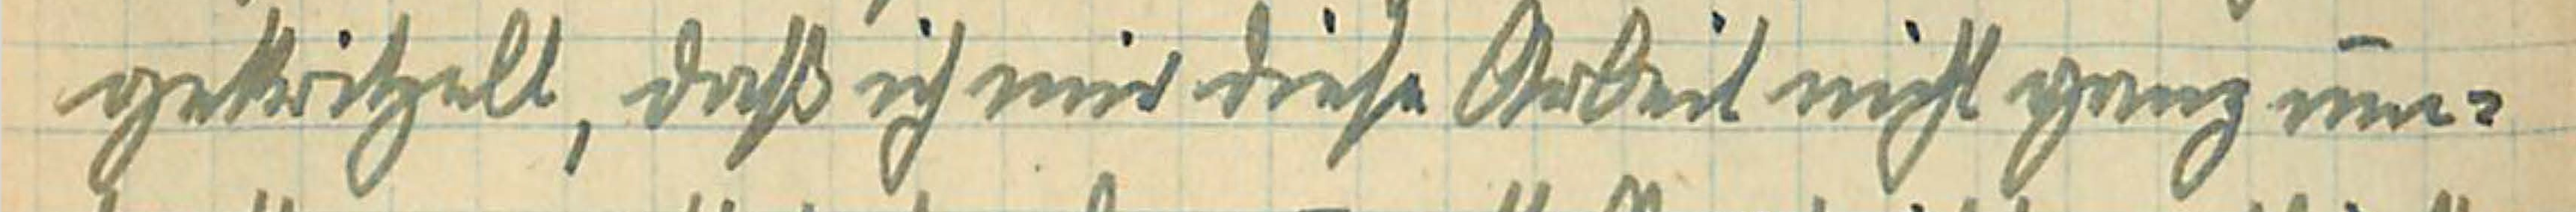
gekritzelt, daß ich mir diese Arbeit nicht ganz um-
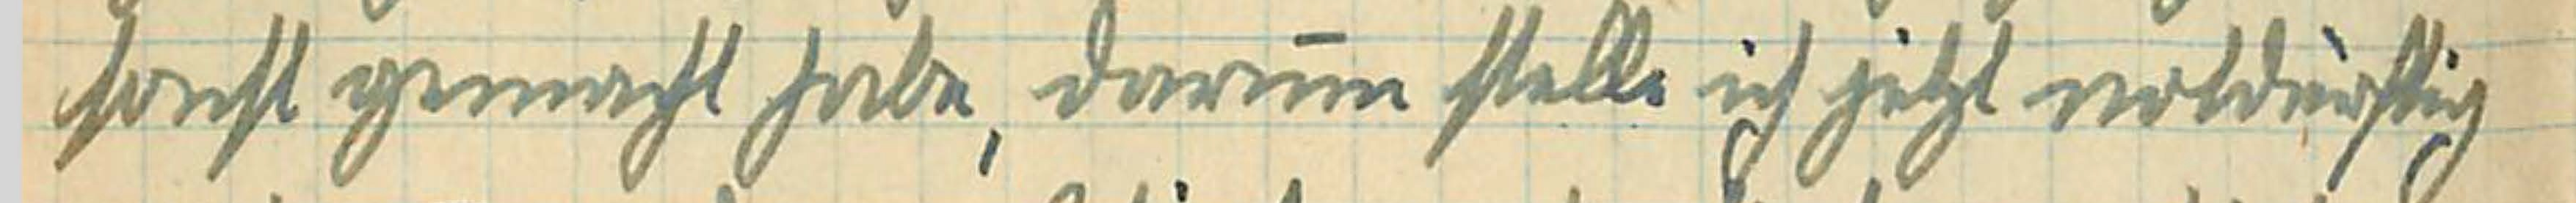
sonst gemacht habe, darum stelle ich jetzt notdürftig
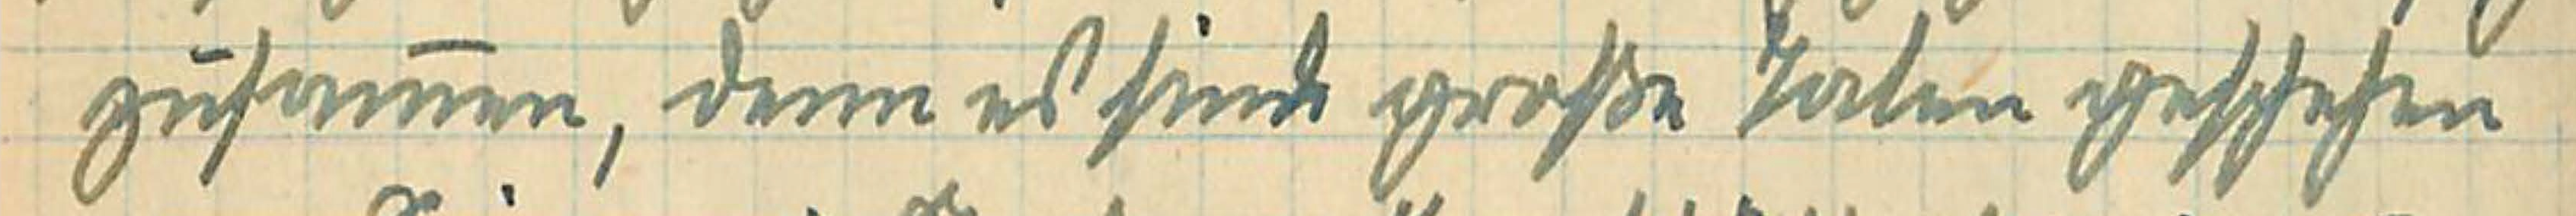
zusammen, denn es sind große Taten geschehen
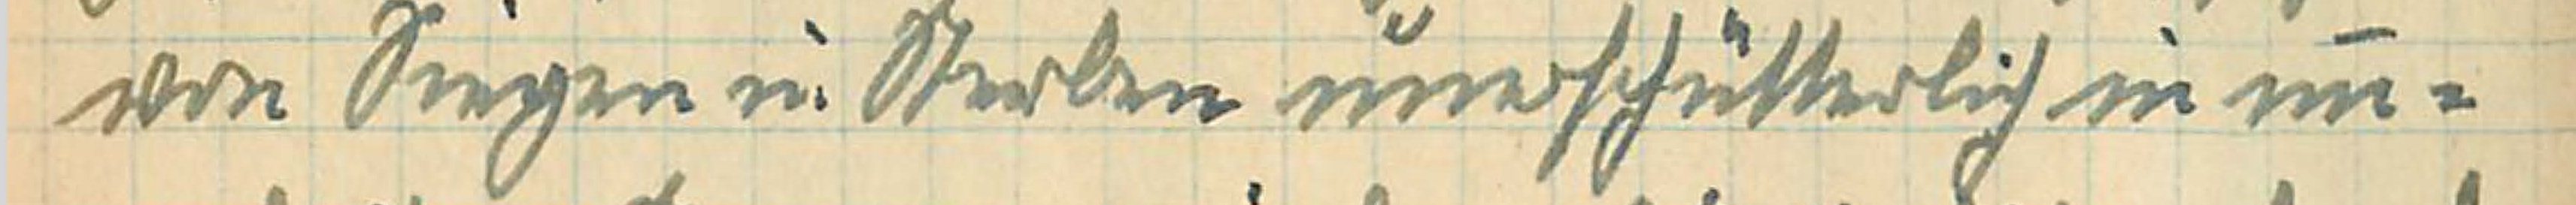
von Siegen u. Sterben unerschütterlich in un-
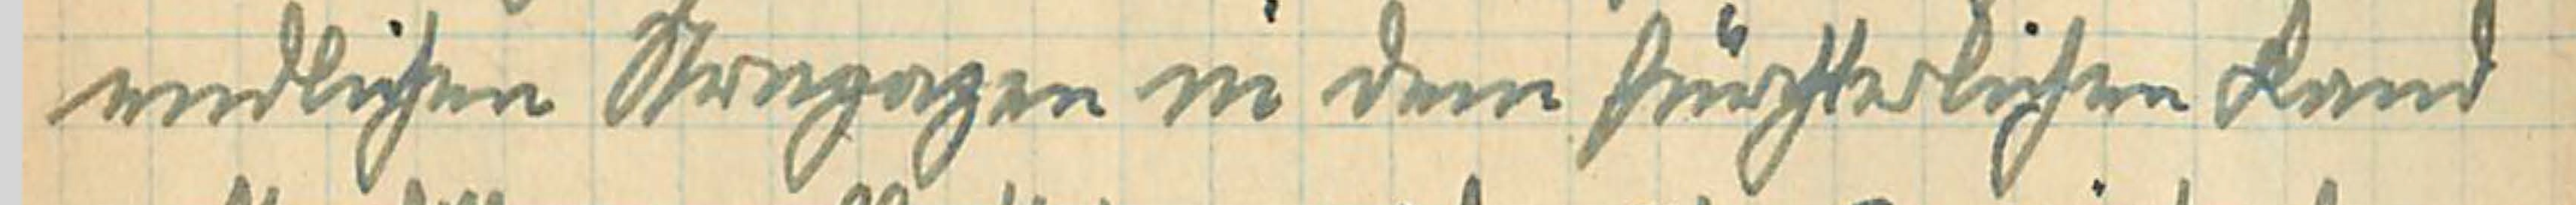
endlichen Strapazen in dem fürchterlichen Land
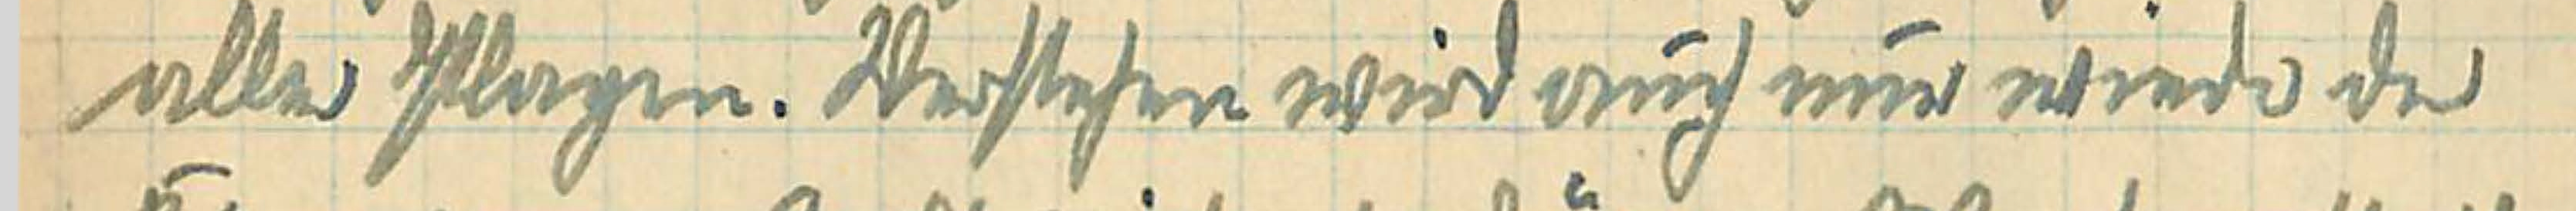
aller Plagen. Verstehen wird auch nur wieder der
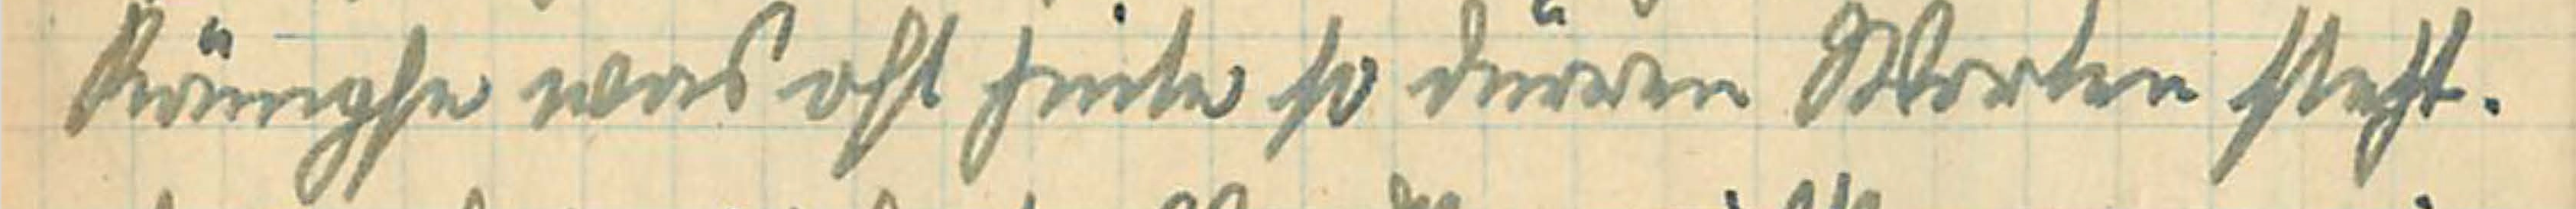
Kämpfer was oft hinter so dürren Worten steht.
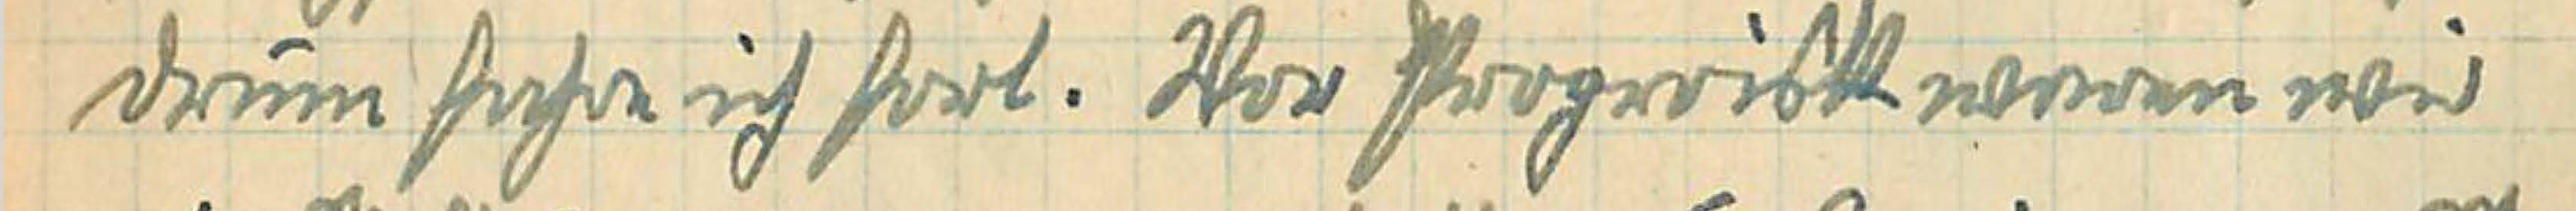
Drum fahre ich fort. Vor Proproisk waren wir
